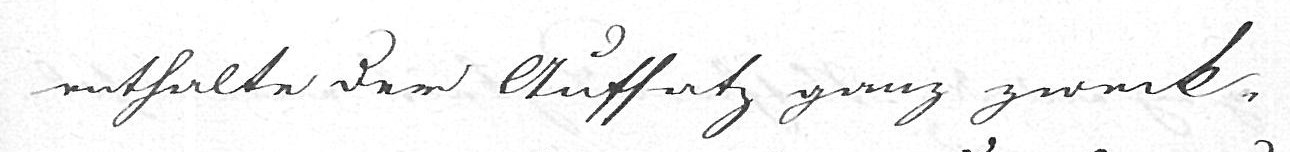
enthalte der Aufsatze ganz zweck-
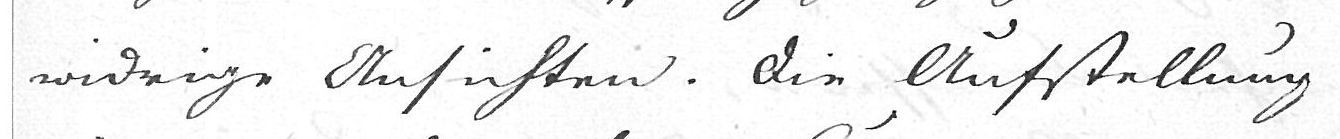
widrige Ansichten. Die Aufstellung
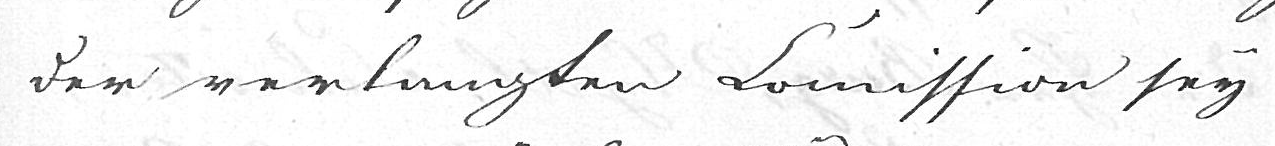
der verlangten Commission sey
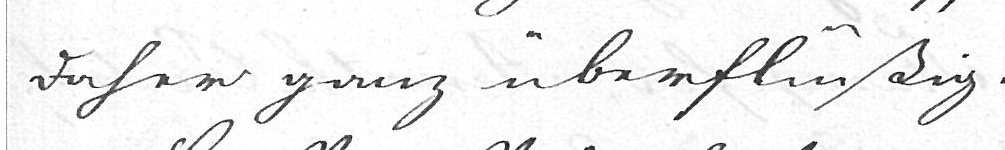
daher ganz überflüßig.
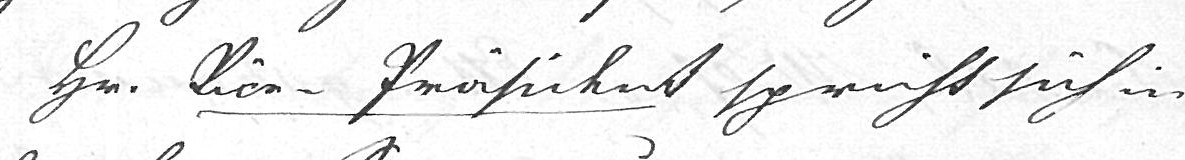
Hr. Vice-Präsident spricht sich in
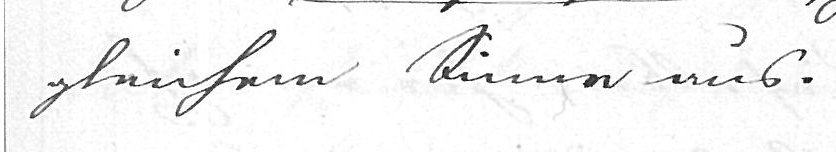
gleichem Sinne aus.
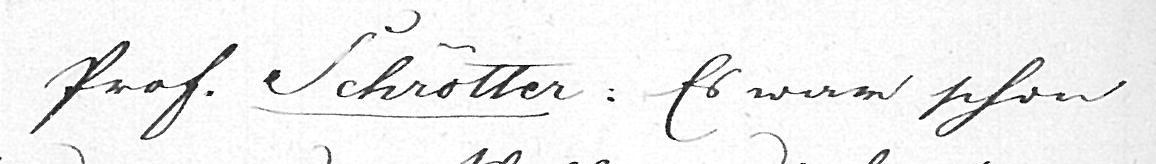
Prof. Schrötter: Es war schon
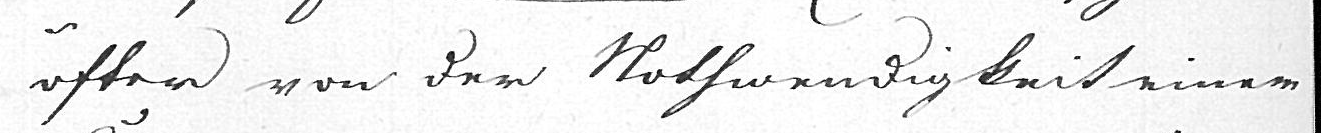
öfter von der Nothwendigkeit einer
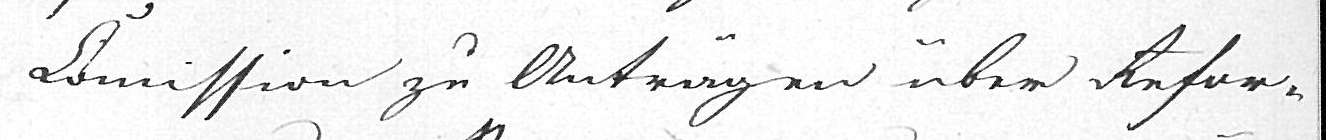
Commission zu Anträgen über Refor-
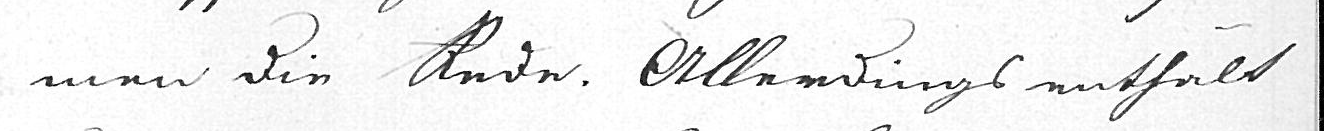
men die Rede. Allerdings enthält
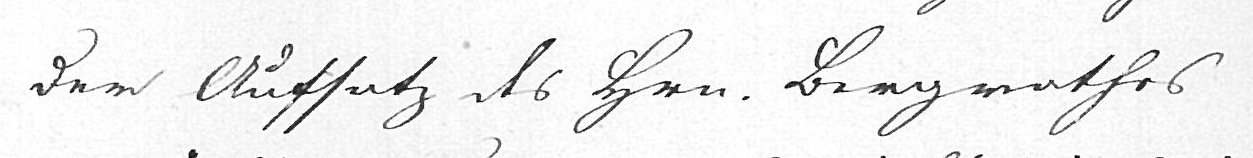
der Aufsstz des Hrn. Bergrathes
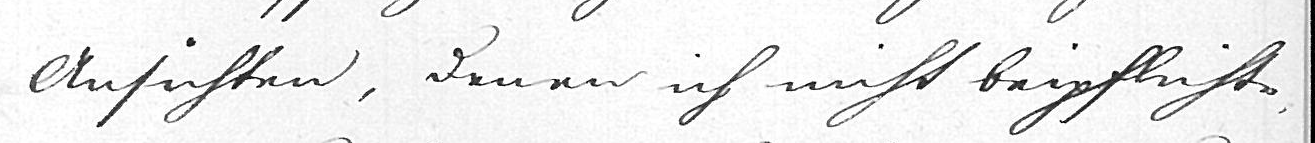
Ansichten, denen ich nicht beipflichte,
